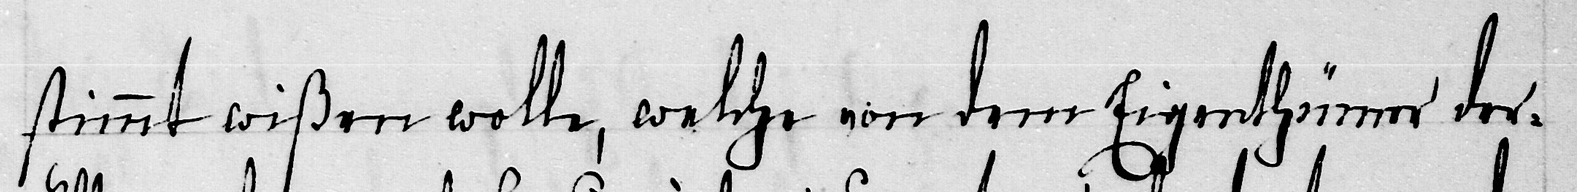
stimmt wißen wolle, welche von dem Eigenthümer der¬
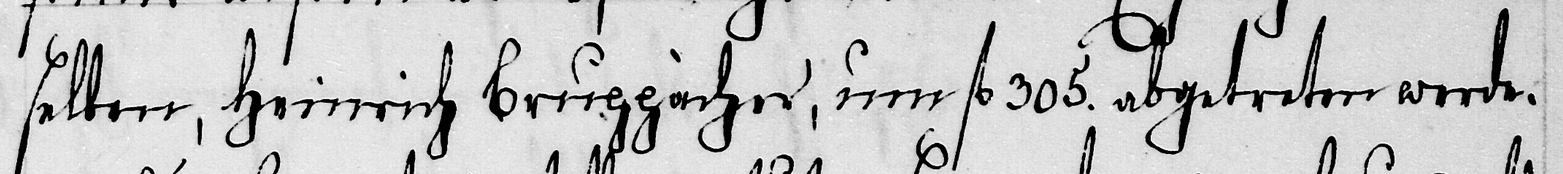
selben, Heinrich Bruppacher, um fl. 305. abgetreten werde.
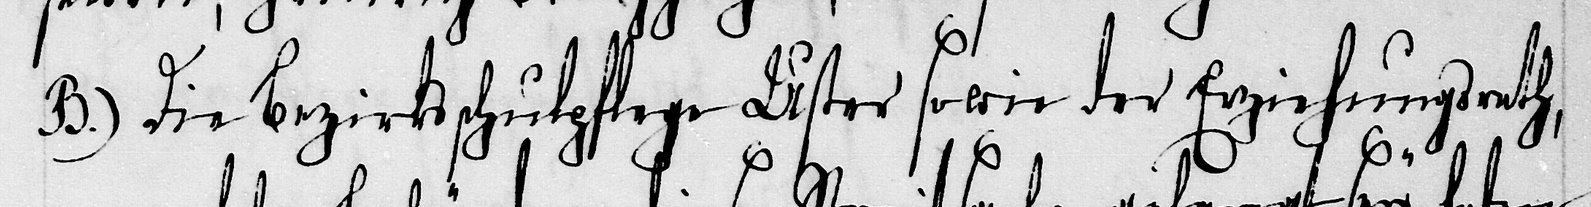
B.) Die Bezirksschulpflege Uster sowie der Erziehungsrath,
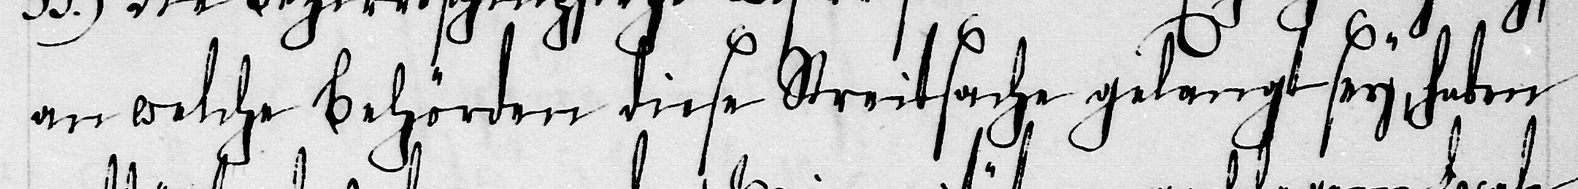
an welche Behörden diese Streitsache gelangt sey, haben
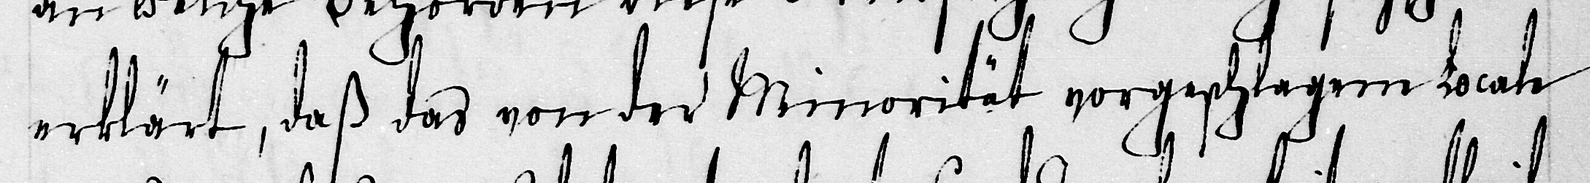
erklärt, daß das von der Minorität vorgeschlagene Locale
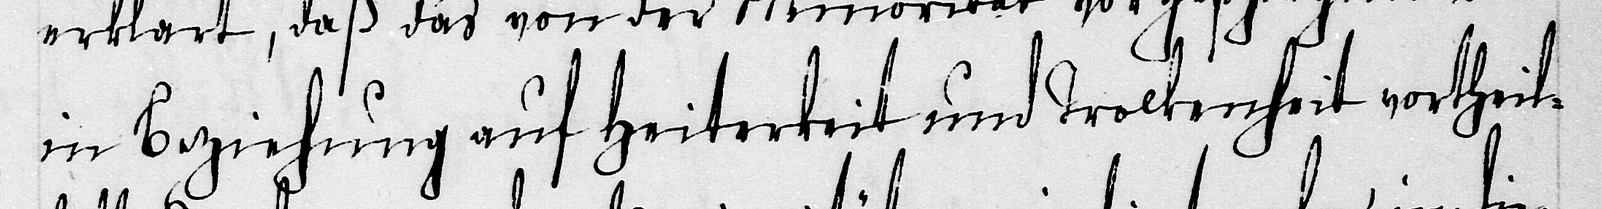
in Beziehung auf Heiterkeit und Trockenheit vortheil¬
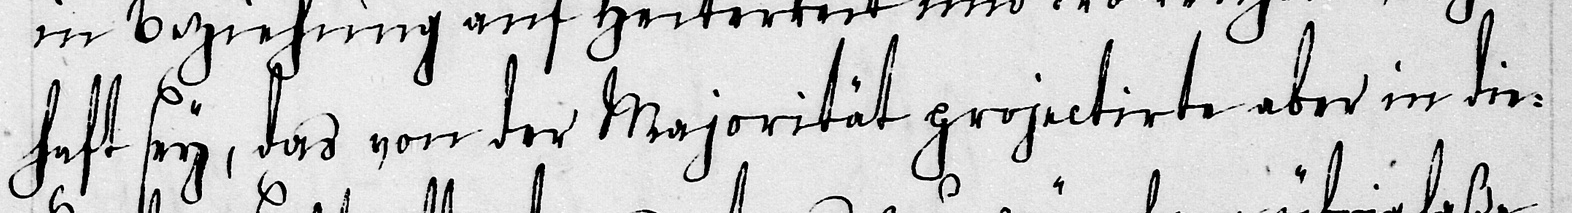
haft sey, das von der Majorität projectirte aber in die¬
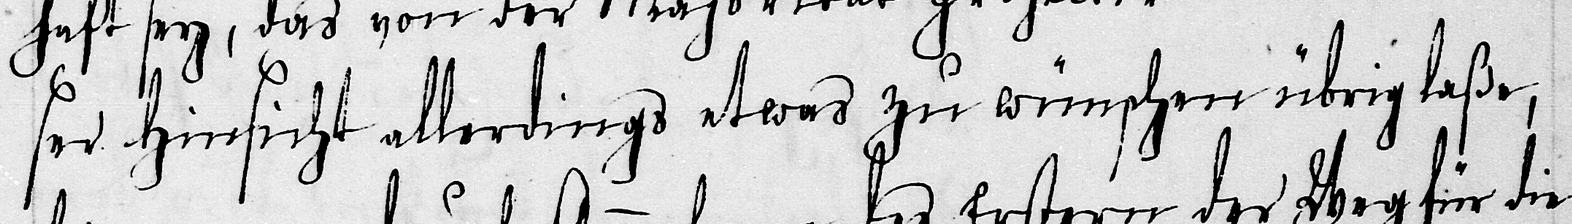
ser Hinsicht allerdings etwas zu wünschen übrig laße,
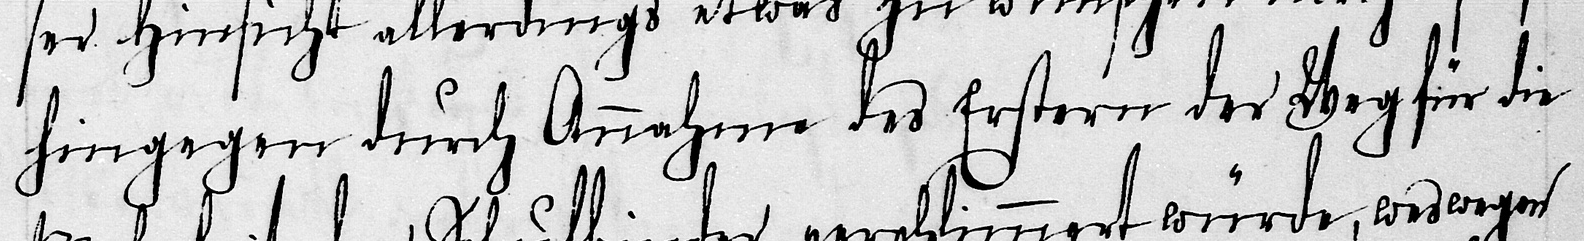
hingegen durch Annahme des Erstern der Weg für die
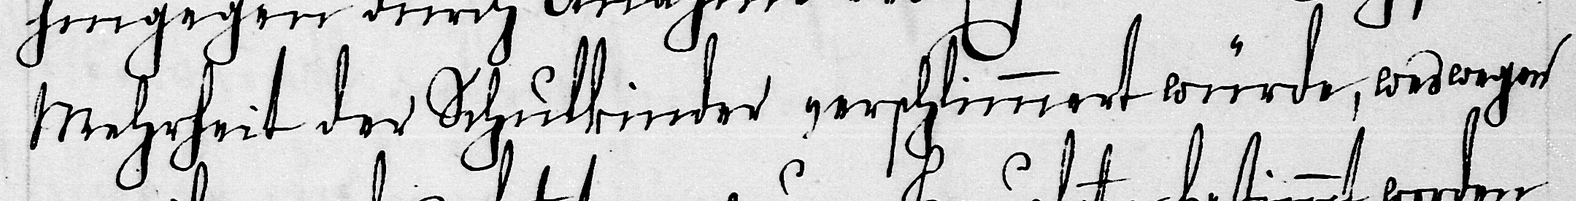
Mehrheit der Schulkinder verschlimmert würde, weswegen
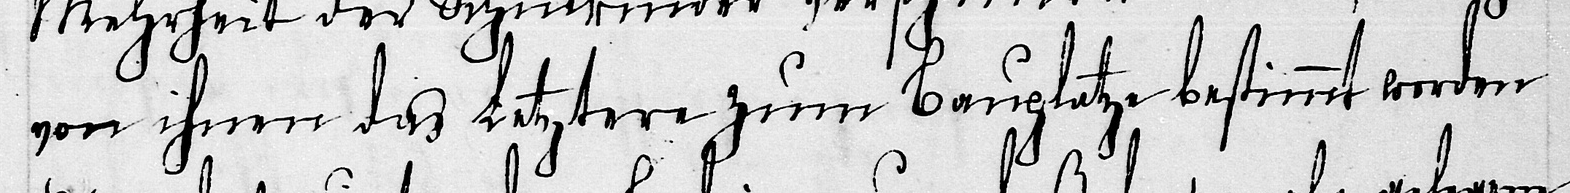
von ihnen das Letztere zum Bauplatze bestimmt worden
